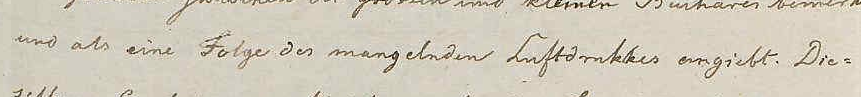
und als eine Folge des mangelnden Luftdrukkes angiebt. Die-
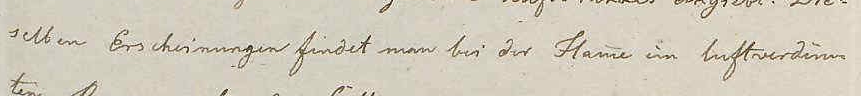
selben Erscheinungen findet man bei der Flam̃e im luftverdün-
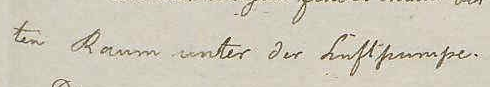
ten Raum unter der Luftpumpe.
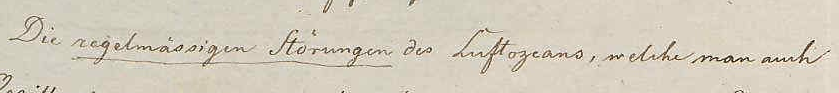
Die regelmässigen Störungen des Luftozeans, welche man auch
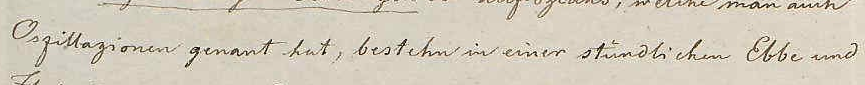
Oszillazionen genant hat, bestehn in einer stündlichen Ebbe und
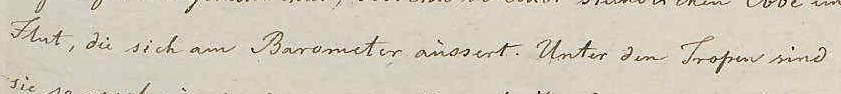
Flut, die sich am Barometer äussert. Unter den Tropen sind
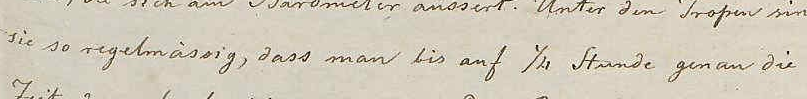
sie so regelmässig, dass man bis auf ¼ Stunde genau die
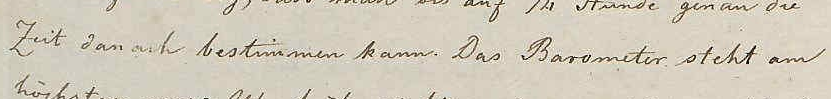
Zeit danach bestimmen kann. Das Barometer steht am
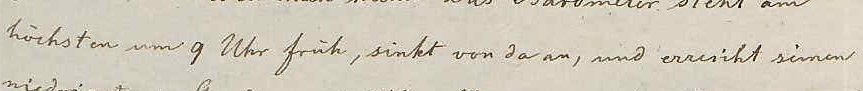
höchsten um 9 Uhr früh, sinkt von da an, und erreicht seinen
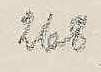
steht
